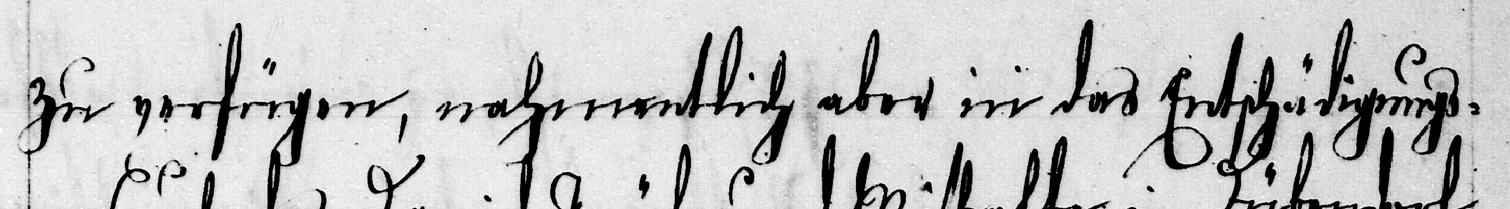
zu verfügen, nahmentlich aber in das Entschädigungs¬
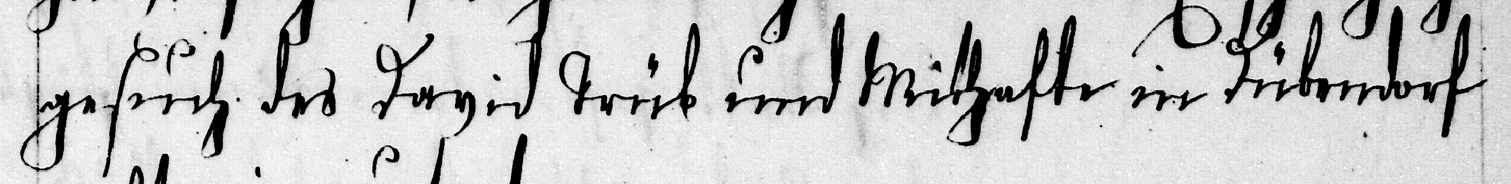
gesuch des David Trüb und Mithafte in Dübendorf
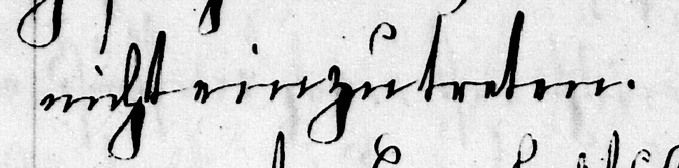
nicht einzutreten.
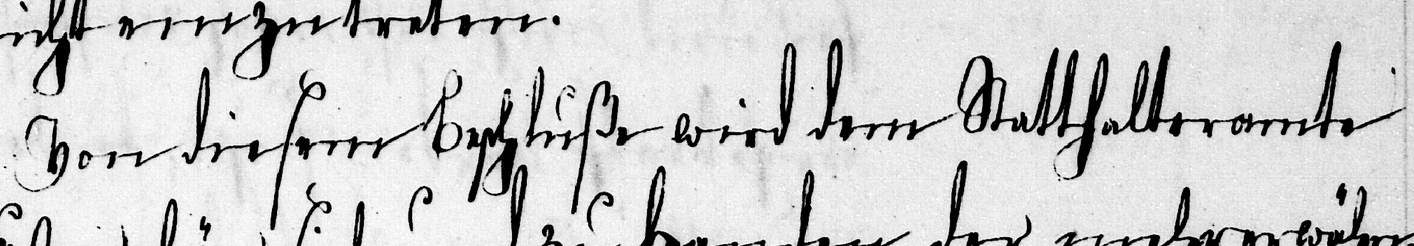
Von diesem Beschluße wird dem Statthalteramte
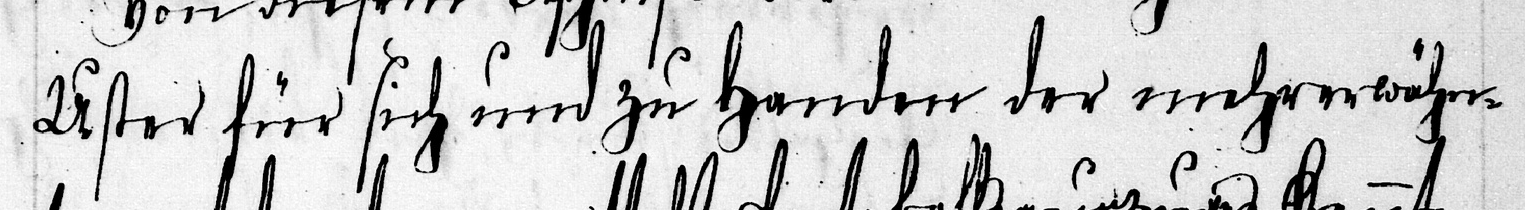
Uster für sich und zu Handen der mehrerwähn¬
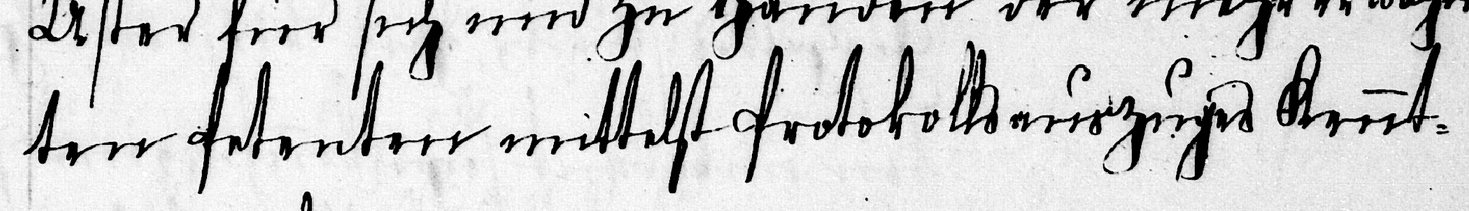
ten Petenten mittelst Protokollsauszuges Kennt¬
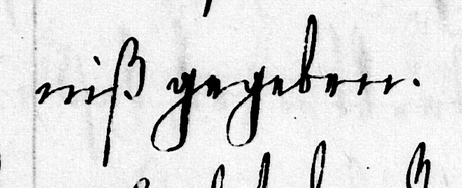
niß gegeben.
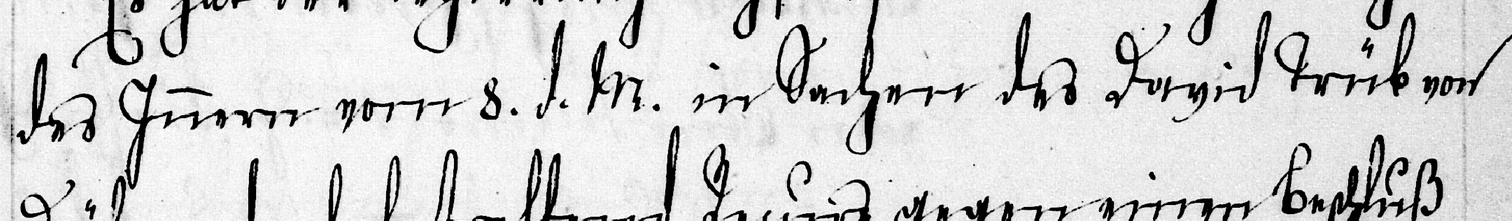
des Innern vom 8. d. M. in Sachen des David Trüb von
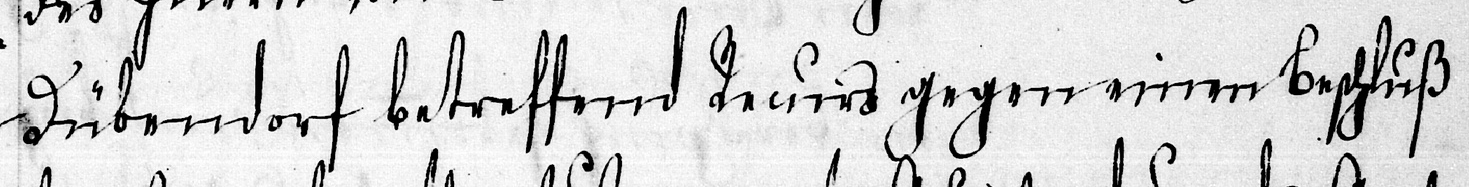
Dübendorf betreffend Recurs gegen einen Beschluß
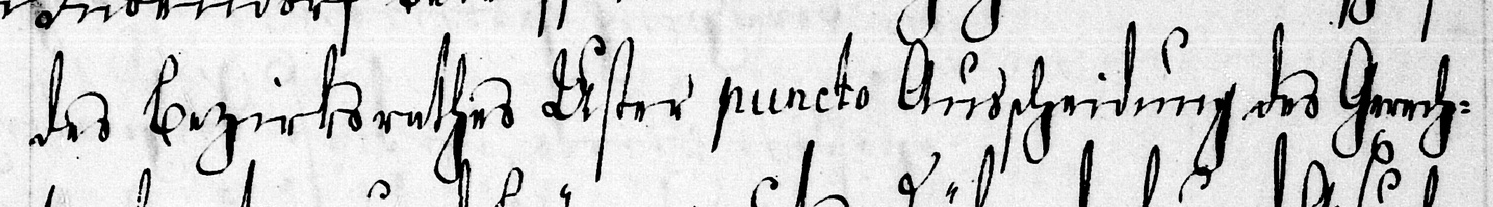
des Bezirksrathes Uster puncto Ausscheidung des Gerech¬
